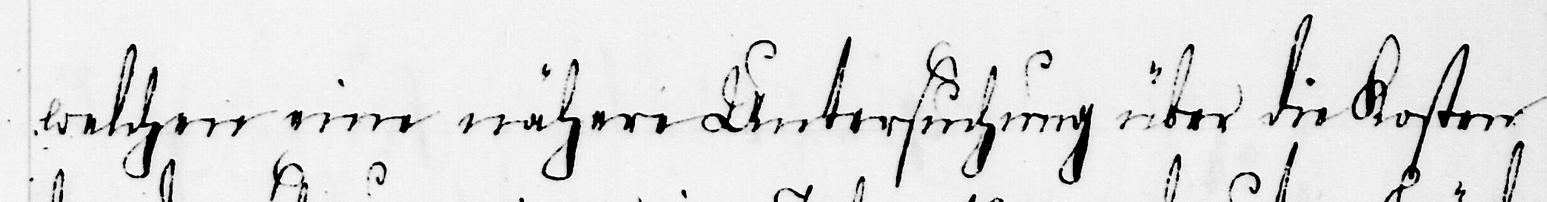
welchen eine nähere Untersuchung über die Kosten
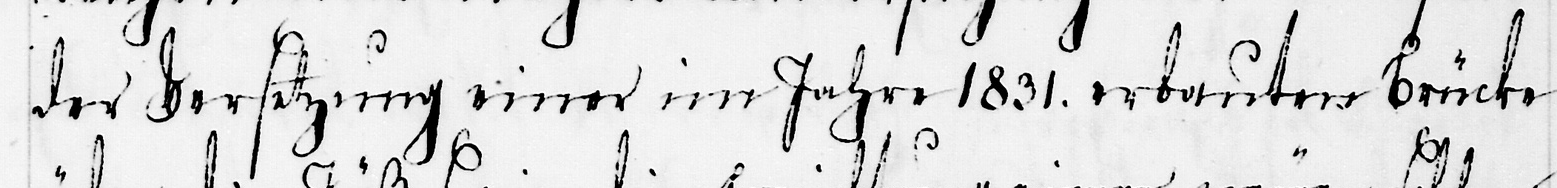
der Versetzung einer im Jahre 1831. erbauten Brücke
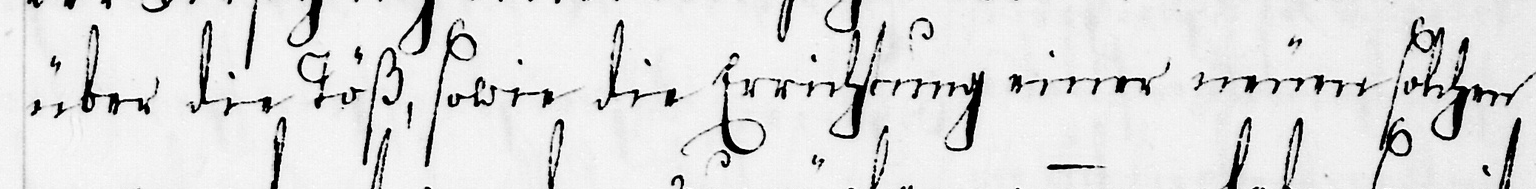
über die Töß, sowie die Errichtung einer neuen solchen
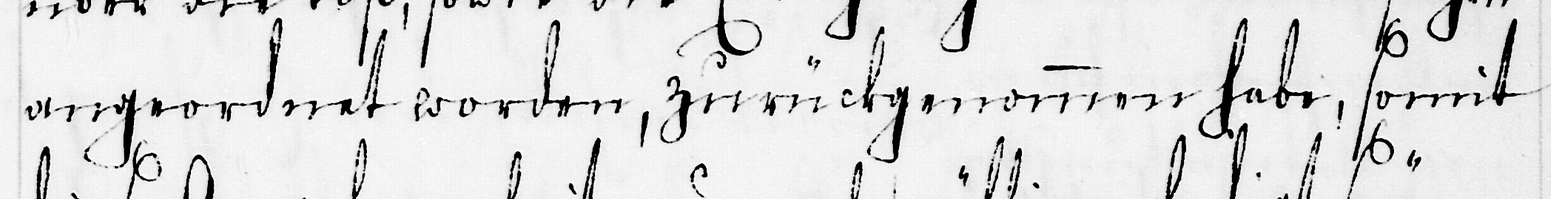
angeordnet worden, zurückgenommen habe, somit
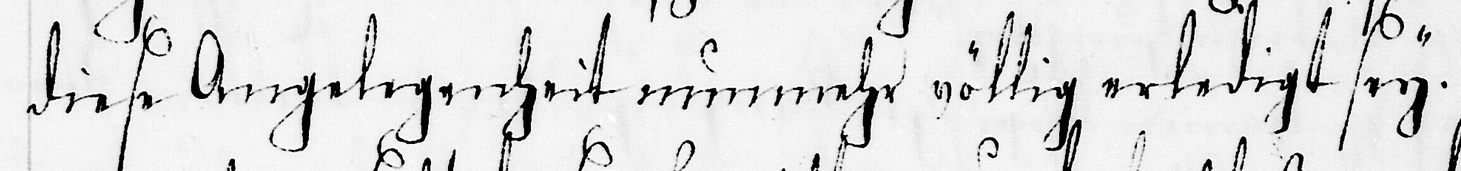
diese Angelegenheit nunmehr völlig erledigt sey.
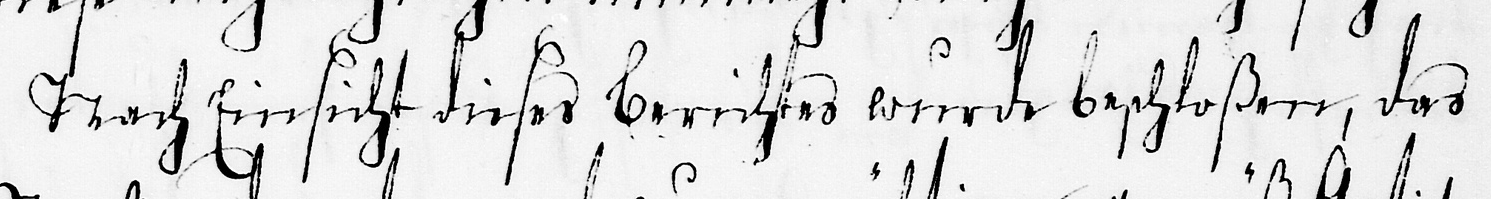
Nach Einsicht dieses Berichtes wurde beschloßen, das
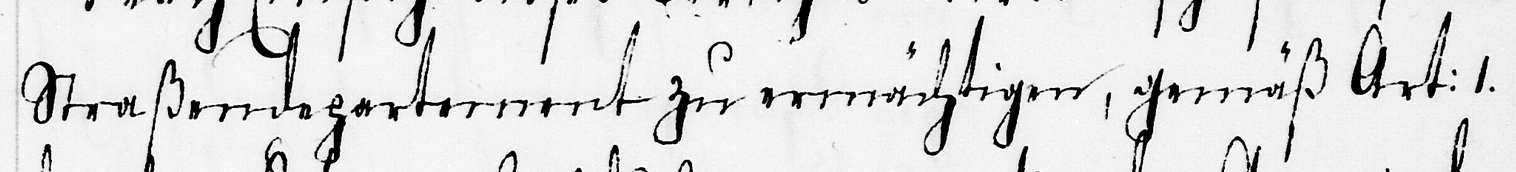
Straßendepartement zu ermächtigen, gemäß Art: 1.
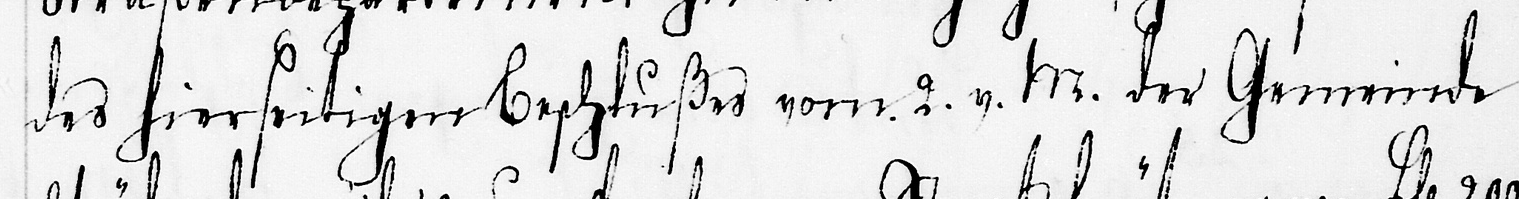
des hierseitigen Beschlußes vom 2. v. M. der Gemeinde
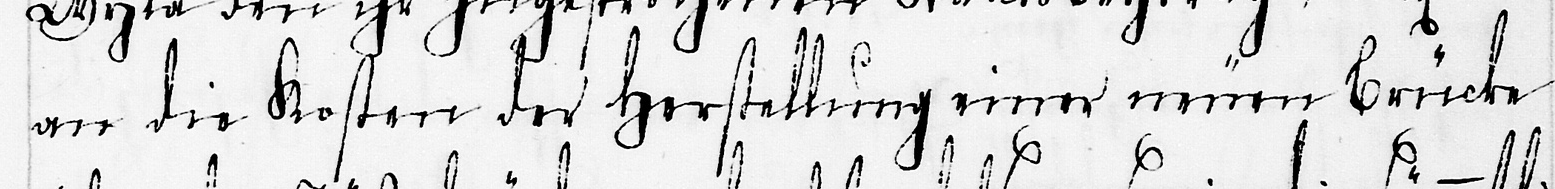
an die Kosten der Herstellung einer neuen Brücke
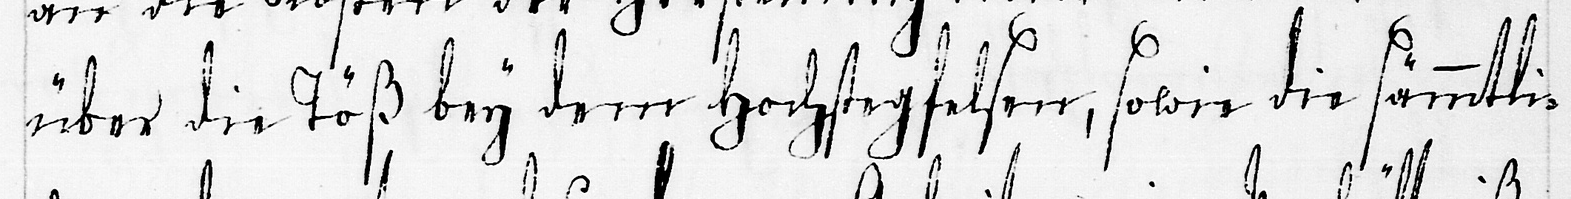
über die Töß bey dem Hochstegfelsen, sowie die sämmtli¬
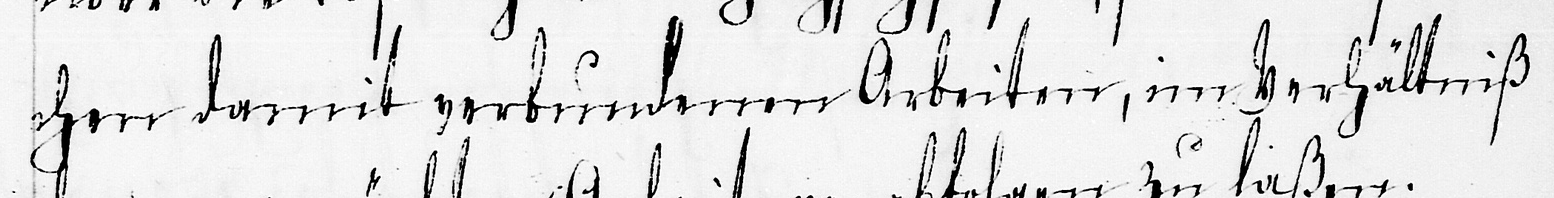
chen damit verbundenen Arbeiten, im Verhältniß
